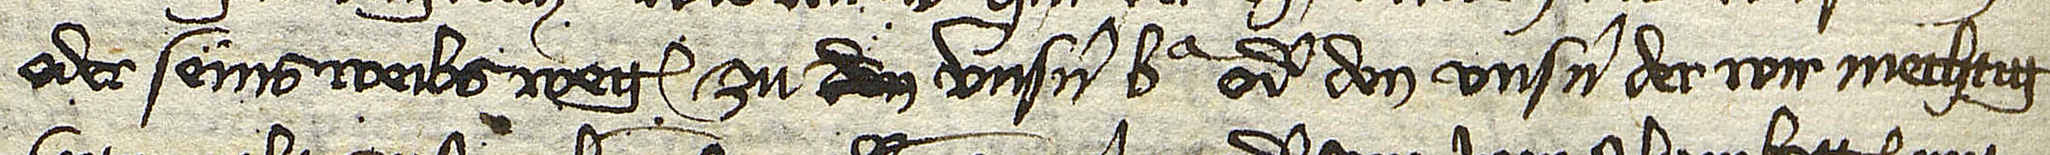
oder ſ eins weibs weg* / ʒu den vnſ*n b* od* den vnſ*n der wir mechtig
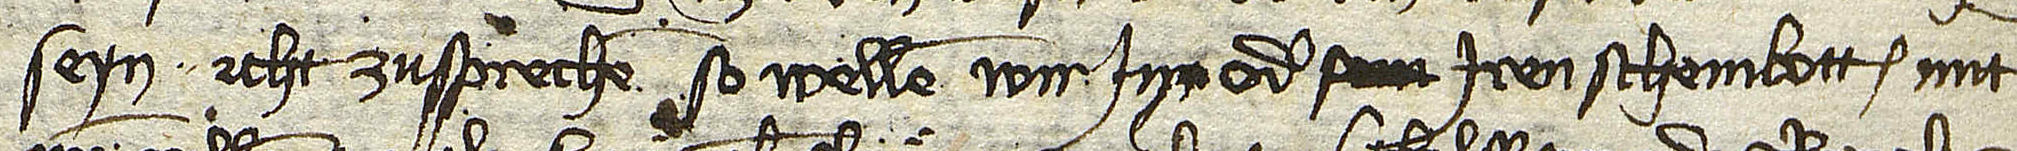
ſeyn . icht ʒuſpreche* ſo welle* wir In od* ſein Iren ſcheinbott* mit
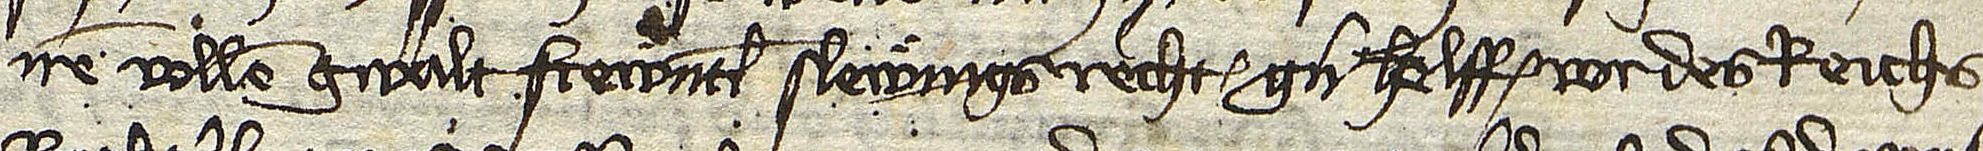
ire* volle* gwalt frewntl* ſlewnigs recht* gn* helff* vor des Reichs
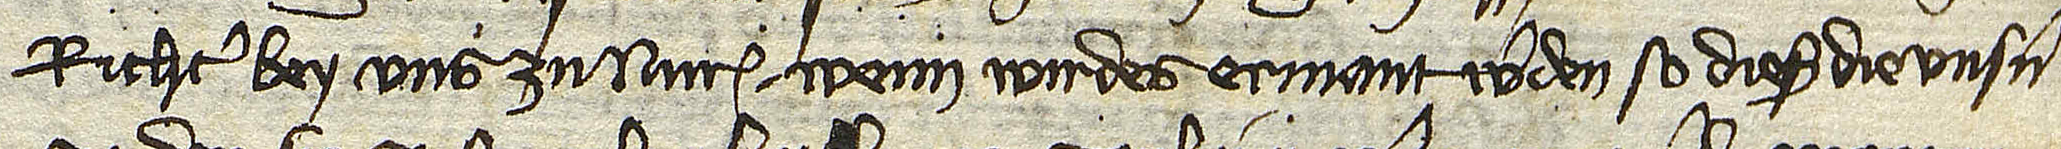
Richt* bey vns ʒu Nur* / wenn wir des ermant w*den ſo dieſ* die vnſ*n
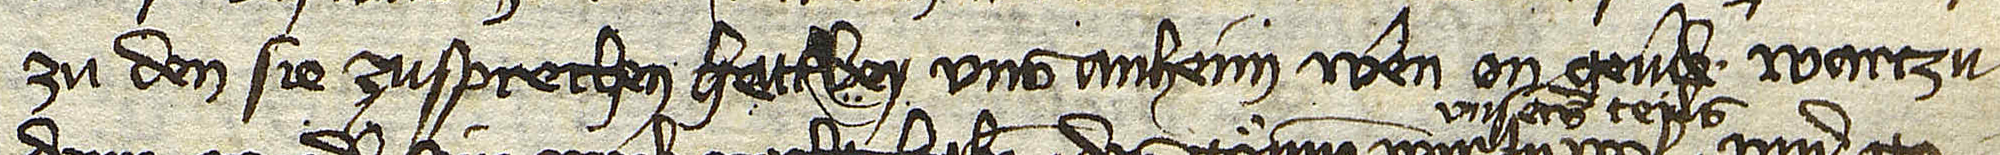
ʒu den ſie ʒuſprechen hett* bey vns anheim w*en on geu*de . warcʒu
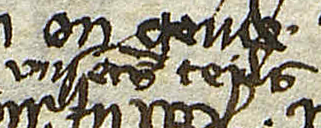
vnſers teils
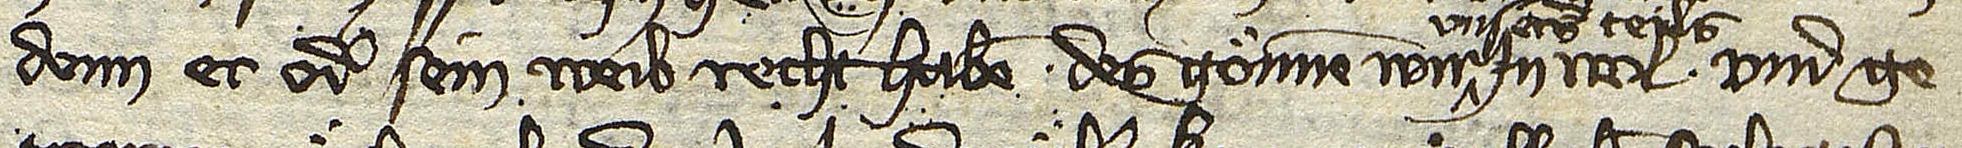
denn er od* ſein weib recht habe* . des gönne* wir In wol . vnd ge =
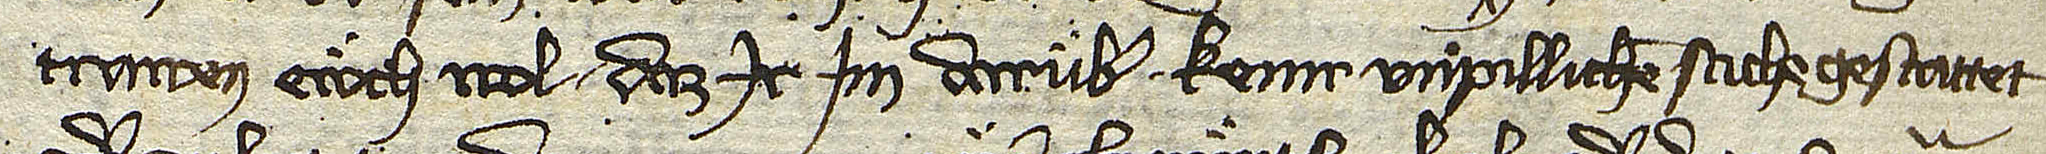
trawen ewch wol / daʒ Ir Im darüb* keinr vnpilliche* ſache geſtattet
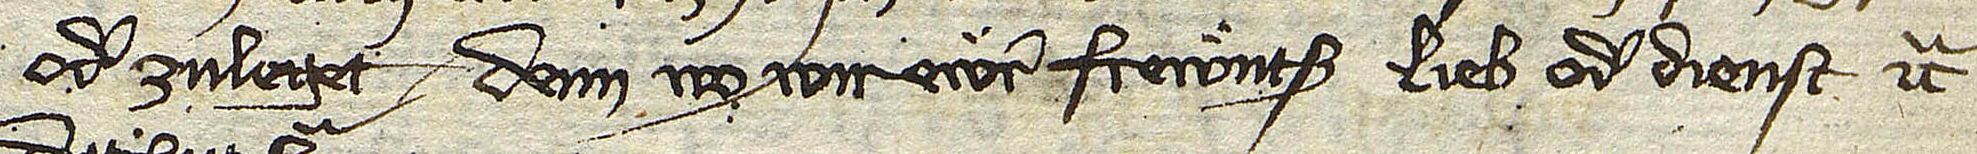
od* ʒuleget / Denn wo wir ewr* frewntſ* lieb od* dienſt ec*
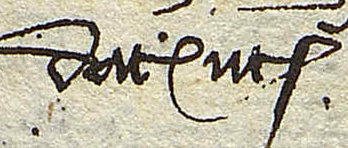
Dat* ut ſ*
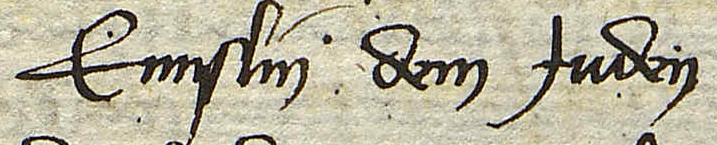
Ennſlin dem Iuden
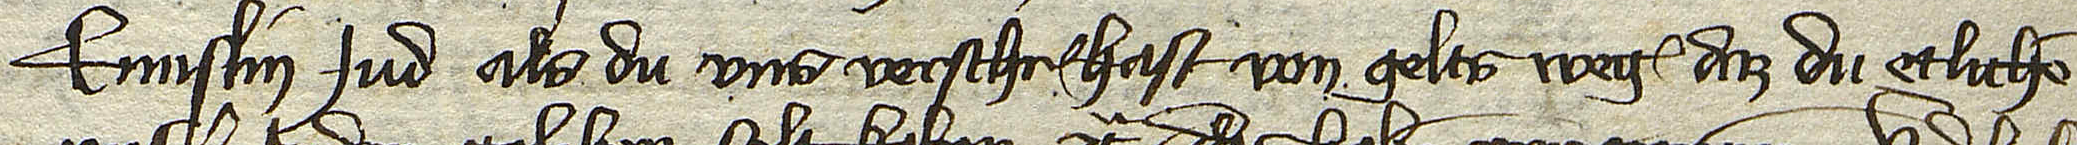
Ennſlin Iud als du uns verſchr* haſt von gelts weg* daʒ du etliche*
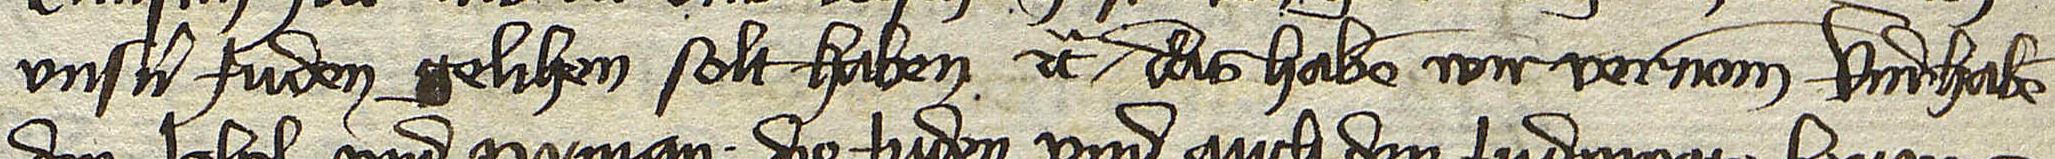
vnſ*n Iuden gelihen ſolt haben ec* / das habe* wir vernom* Vnd habe*
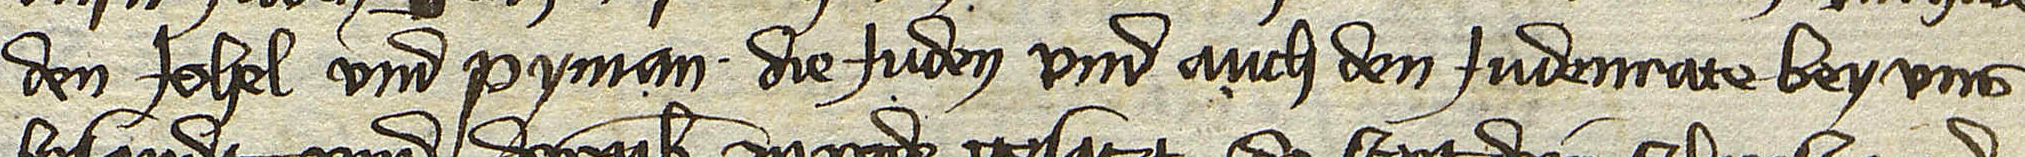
den Iohel und Pyman . die Iuden vnd auch den Iudenrate bey vns
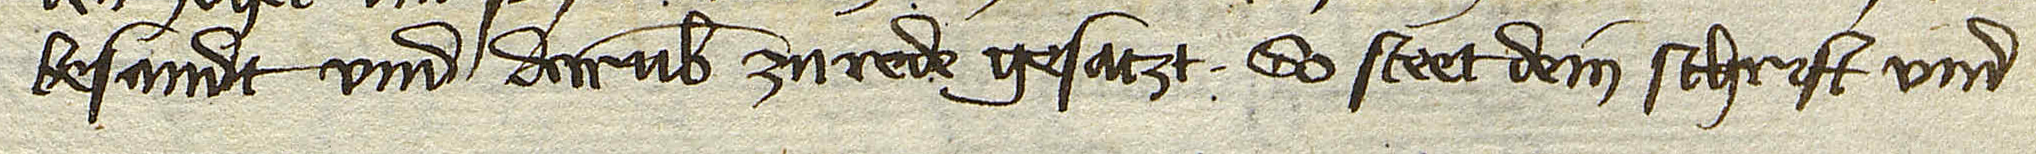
beſandt vnd darub* ʒu rede geſacʒt . So ſteet dein ſchrift vnd
